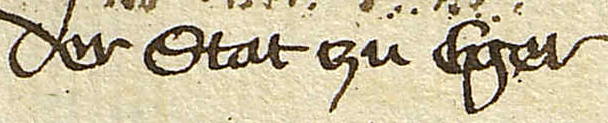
der Stat cʒu Eger
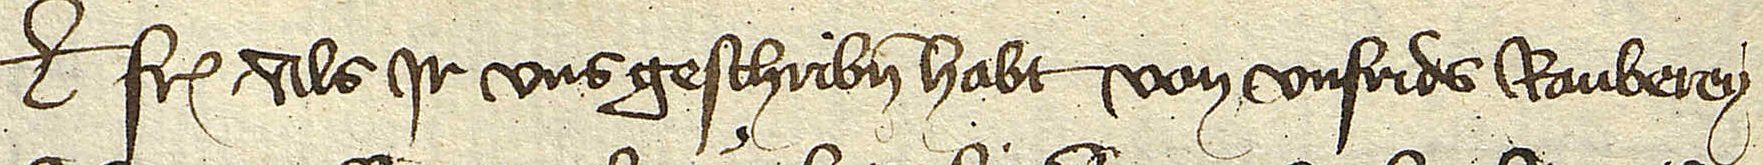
L* fr* / Als Ir vns geſchribn* habt von vnfrids Rauberey
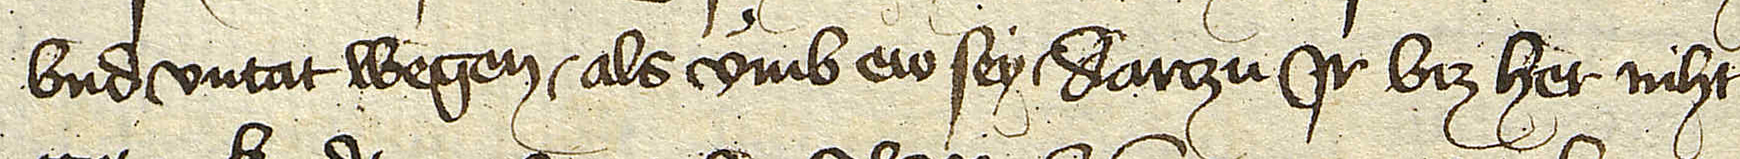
vnd vntat wegen / als v̈mb ew ſey / Darcʒu Ir biʒ her niht
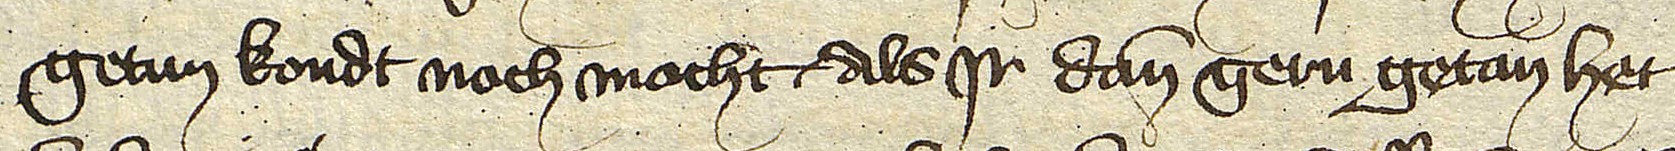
getun kondt noch mocht / Als Ir dan* gern getan het
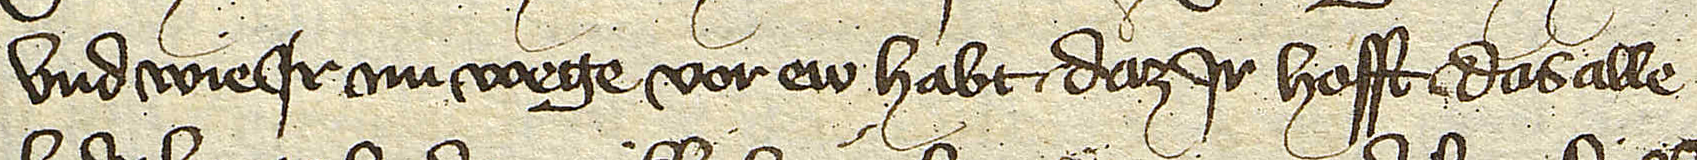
vnd wie Ir nu wege vor ew habt / daʒ Ir hofft / das alle
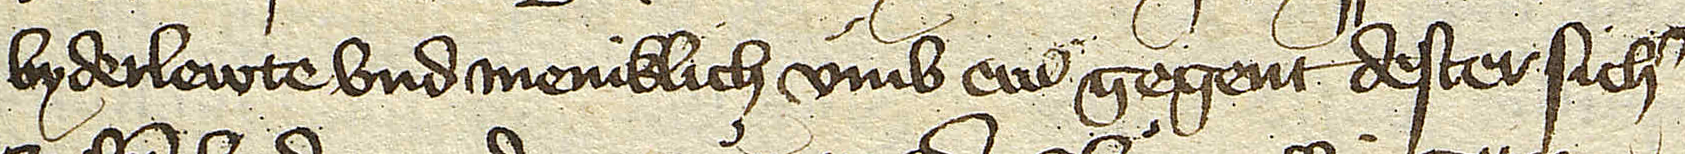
byderlewte vnd meniklich v̈mb ew* gegent deſter ſich*
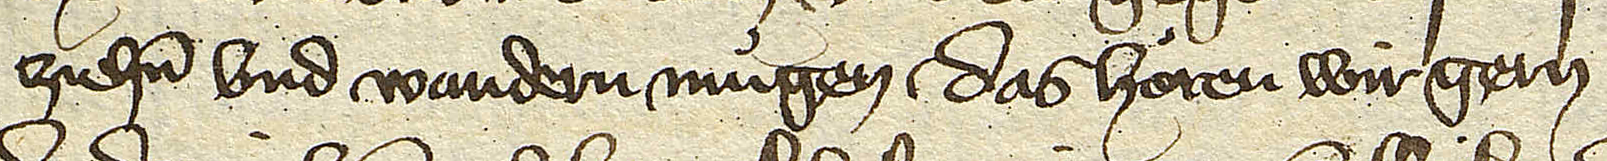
cʒiehn* vnd wandern mügen / das hören wir gern
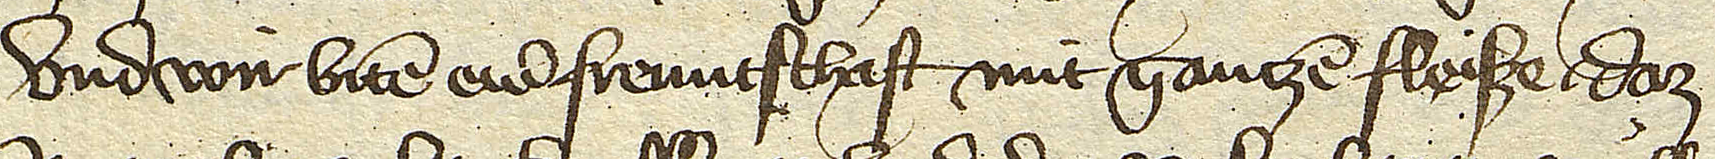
vnd wir bite* ew* freuntſch* mit gancʒe* fleiſʒe / daʒ
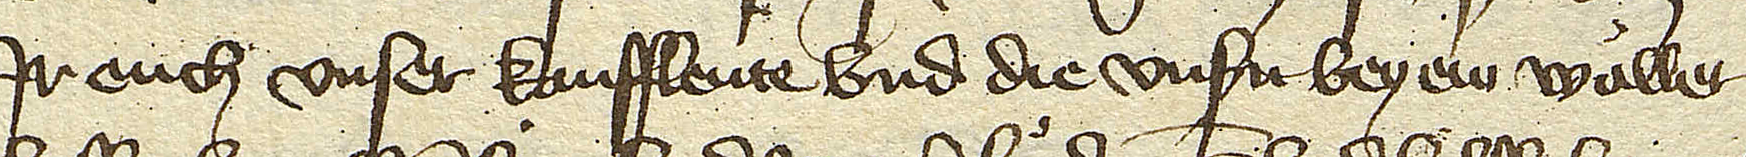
Ir euch vnſer kauffleute vnd die vnſ*n bey ew wöllet
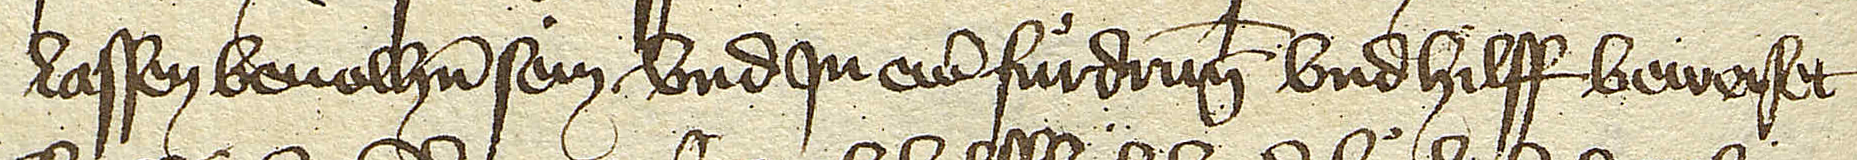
laſſen beuolhn* ſein / vnd In ew* fürdrug* vnd hilff beweiſet
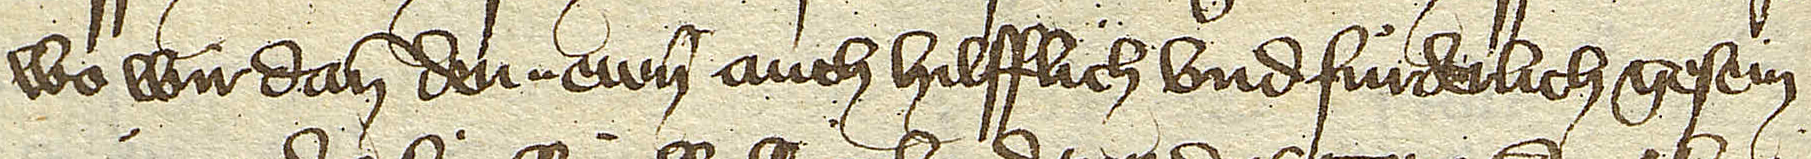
wo wir dan* den ~ ewn* auch hilfflich vnd fürderlich geſein
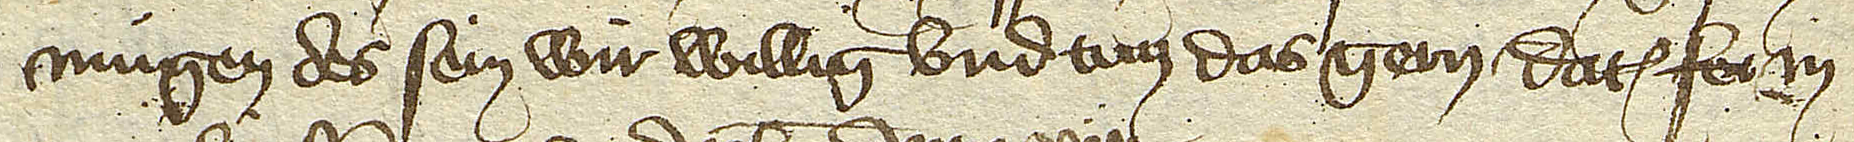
mügen des ſein wir willig vnd tun das gern / dat* fe in
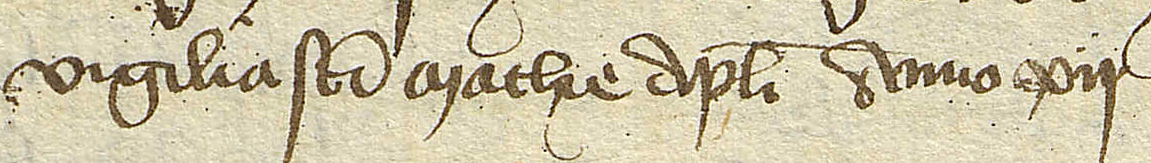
vigilia ſci* Mathie Aoli* Anno xii*
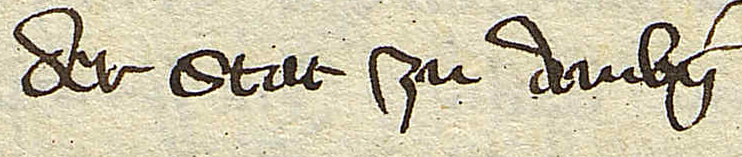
der Stat cʒu Ambg*
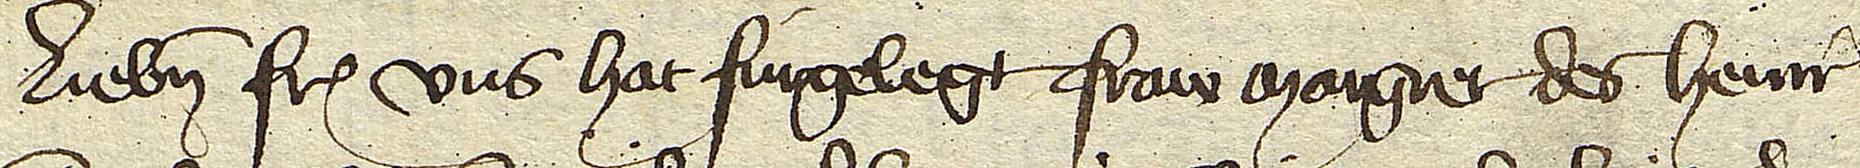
Liebn* fr* vns hat fürgelegt fraw Margret des heinr*
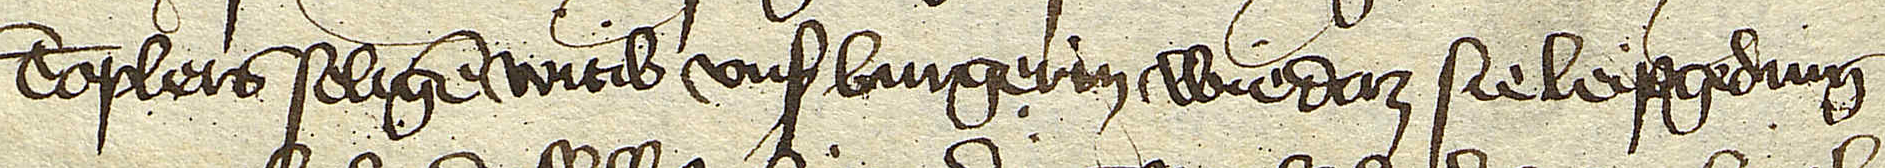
Toplers ſelige* witib vnſ* burgerin / wie daʒ ſie leipgeding
